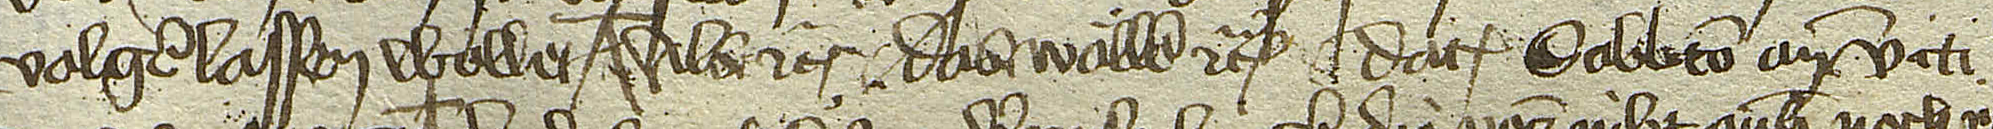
volge* laſſen wöllet / Als ec* / das wölle* ec* / dat* Sabbto* an* viti
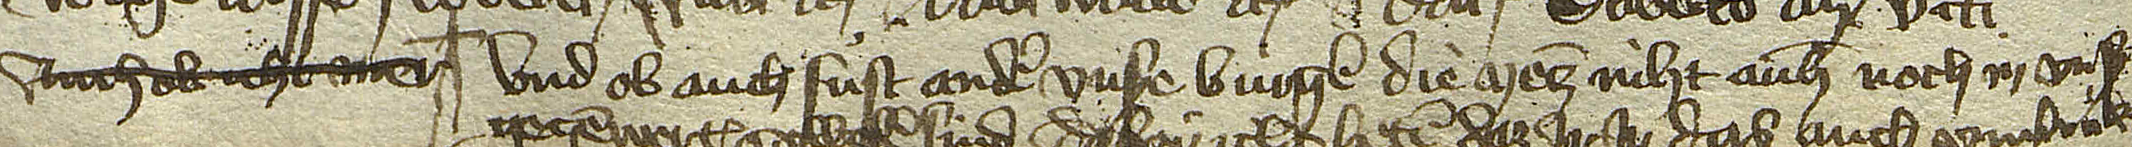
Auch ob icht mer vnd ob auch füſt and* vnſ*e burge* die yecʒ* niht auh* noch in vnſ*
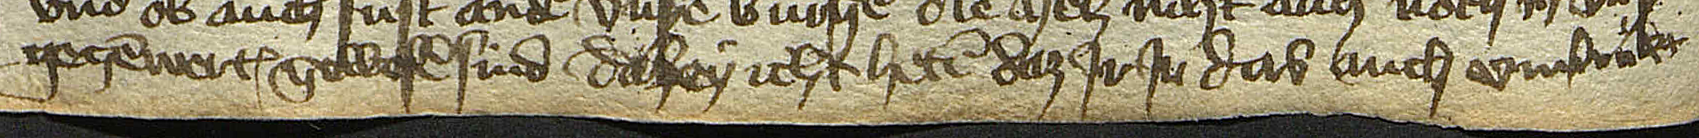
gege*wert* geweſe* ſind / dabey icht hete* daʒ Ir In das auch vnu*%%%%%
